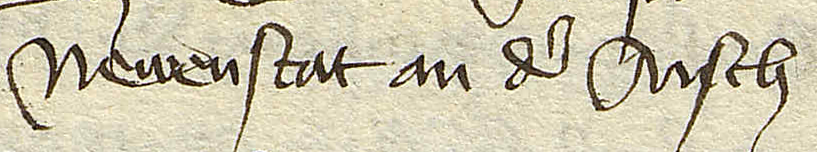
Newenſtat an d* Aiſch
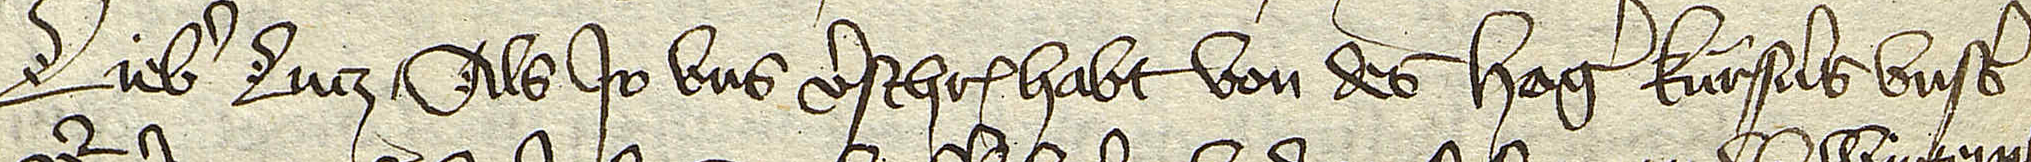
Lieb* Lucʒ / Als Ir vns v*ſchr* habt von des Hag* kürſn*s vnſs*
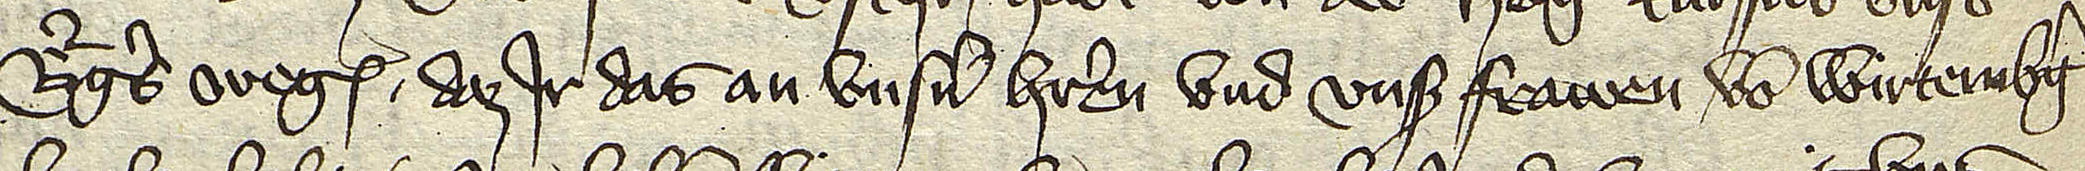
B*g*s weg* / daʒ Ir das an vnſn* hr*en vnd vnſ* frawen vo* wirtemb*g
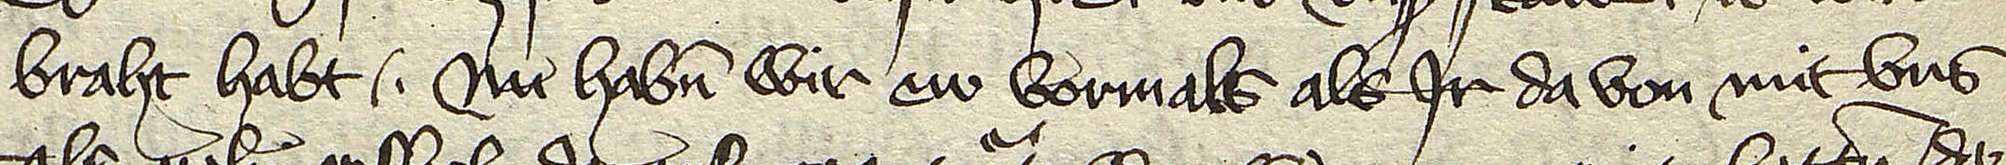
braht habt / . Nu habn* wir ew vormals als Ir da von mit vns
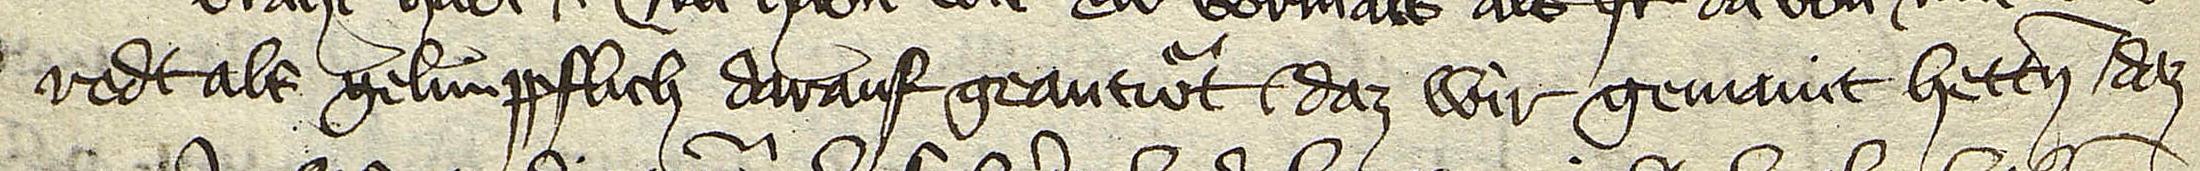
redt als gelimppflich darauf geantwt* / daʒ wir gemaint heten / daʒ
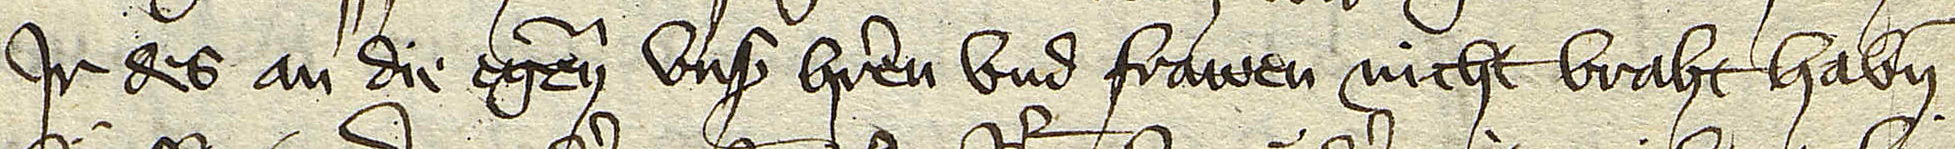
Ir des an die egen* vnſ* hr*en vnd frawen nicht braht habn*
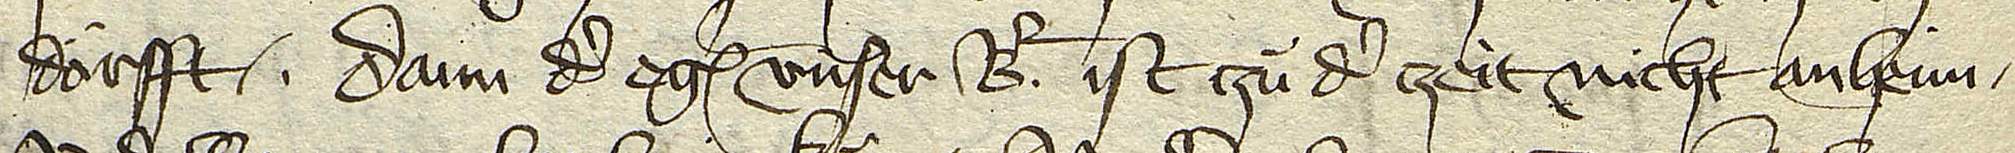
dörfft / . Dann d* eg* vnſer B* . iſt cʒü d* cʒeit nicht anheim /
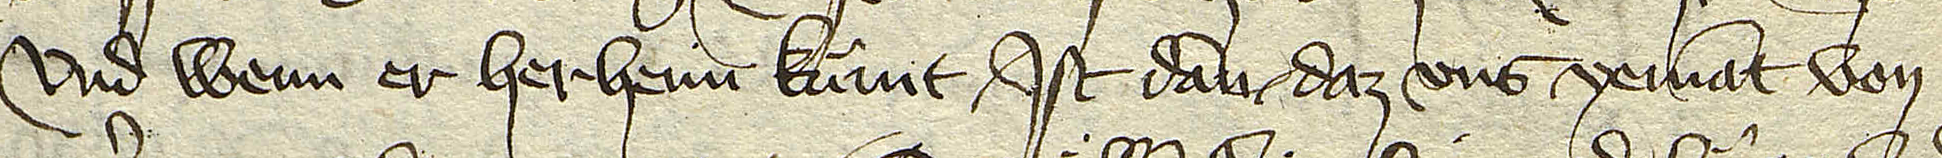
vnd wenn er herheim kümt / Iſt dan* / daʒ vns yemat* von
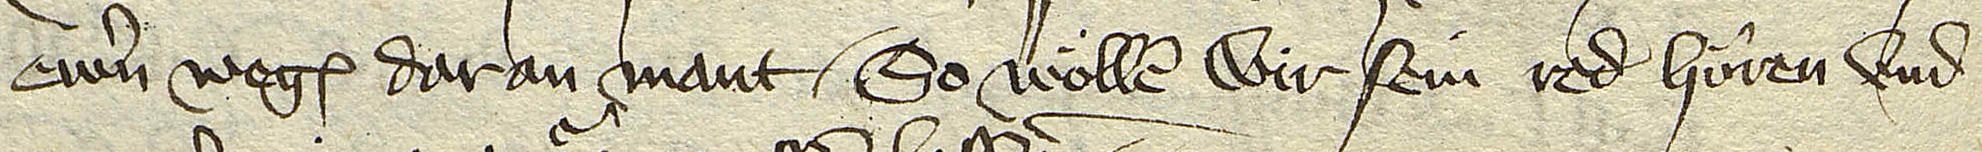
ew*n weg* daran mant / So wölle* wir ſein red hören vnd
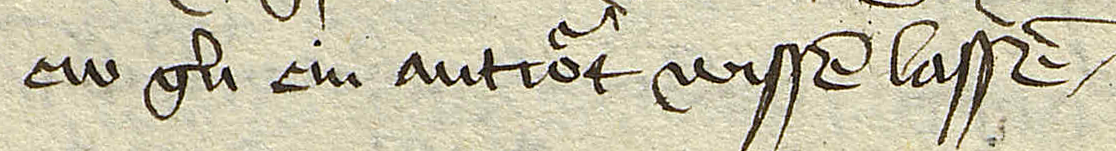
ew g*n ein antwt* wiſſe* laſſe* /
